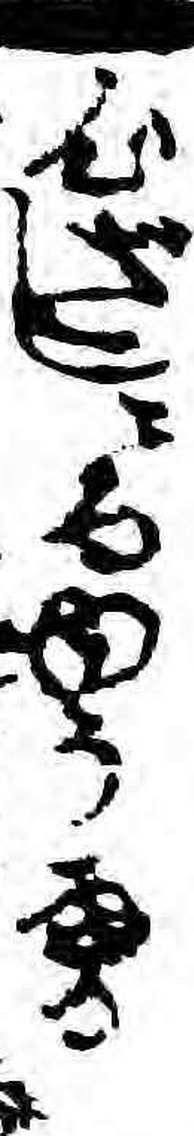心ざしにてゆうなる
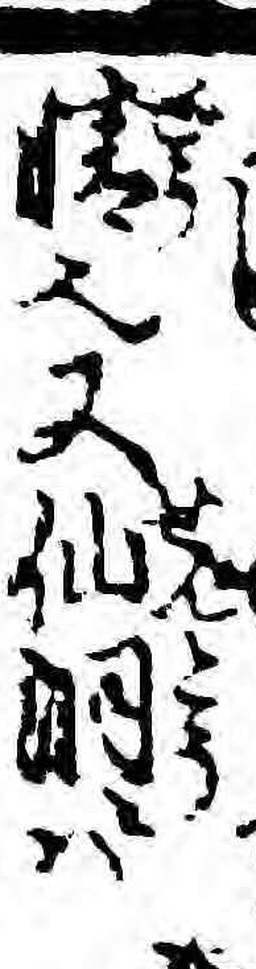情也又仙洞には
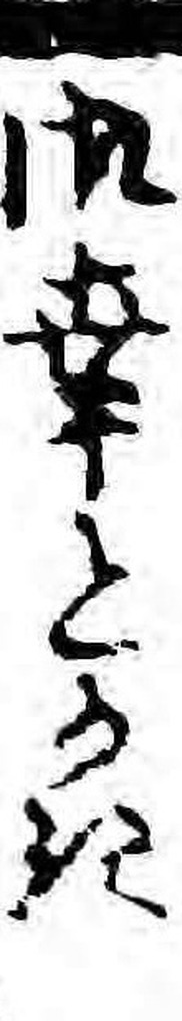御幸とかき
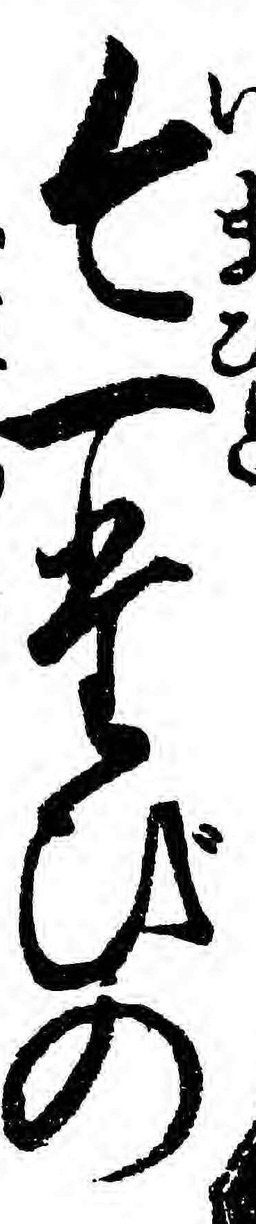今一たびの
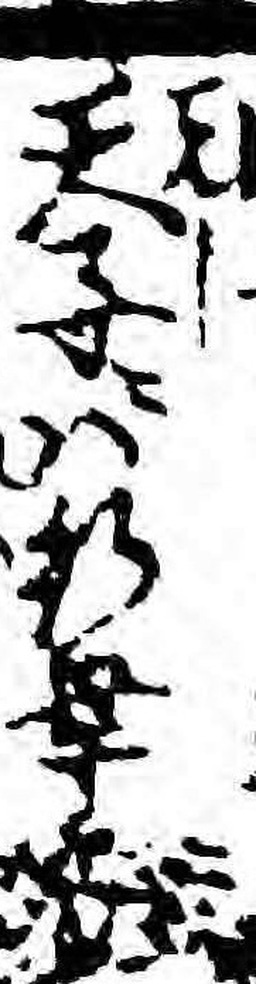天子には行幸
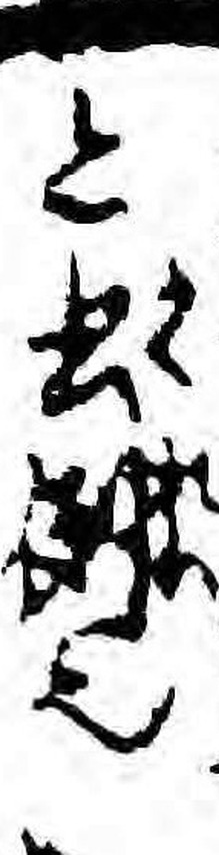と書例也
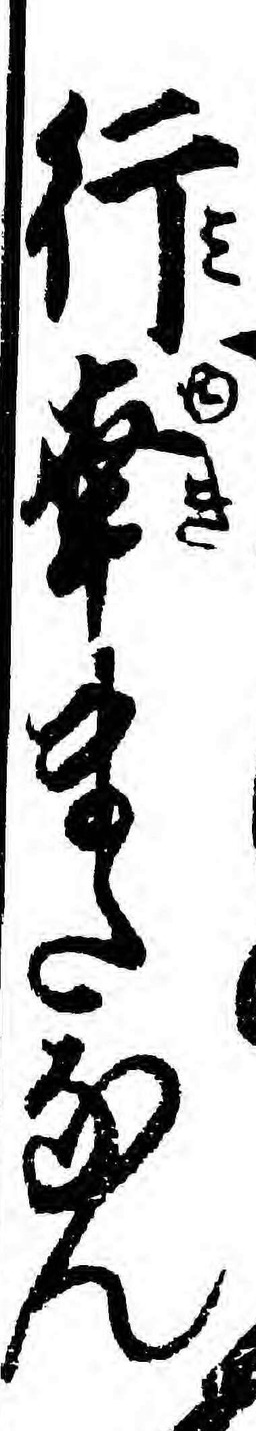行幸またなん
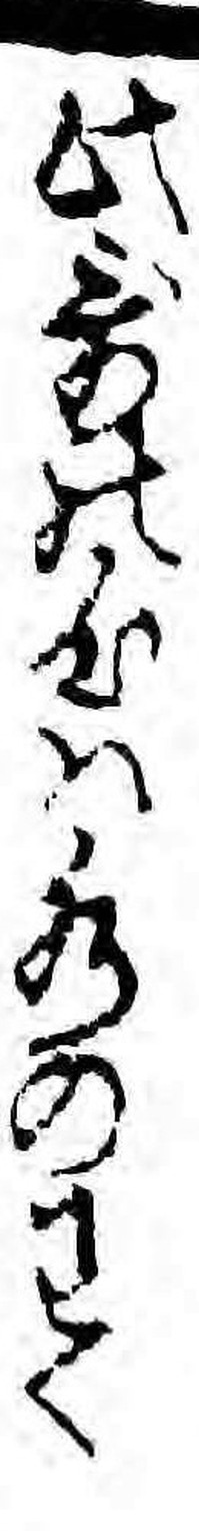此哥の心は水のわく
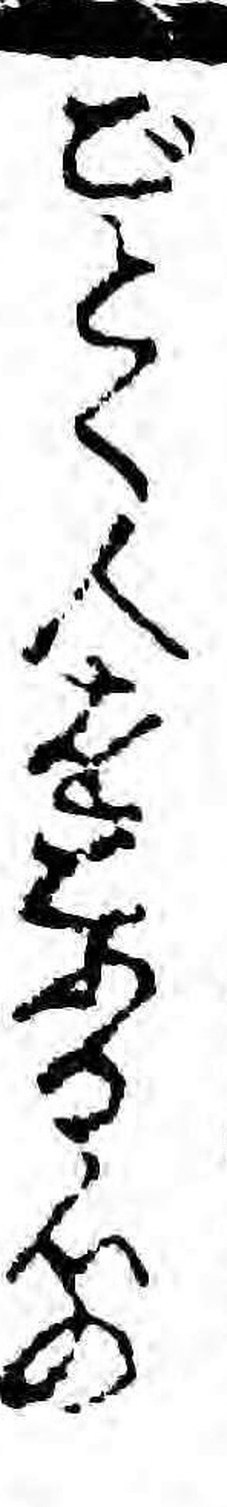ごとく人をこふる心の
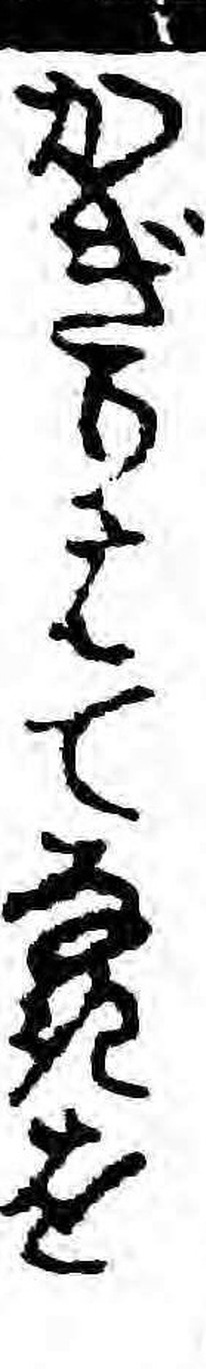かぎりはてなきを
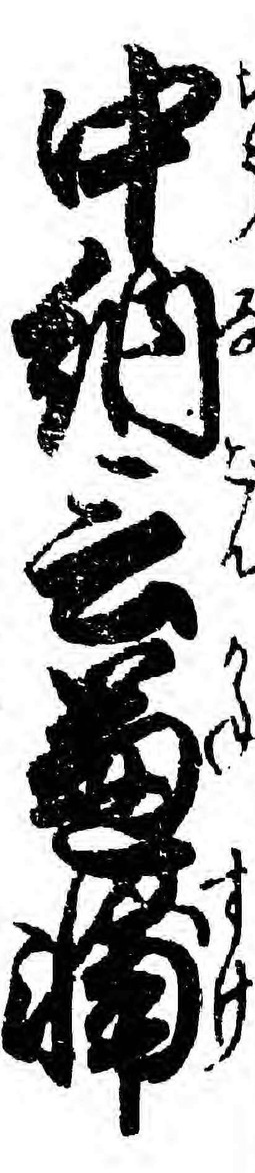中納言兼輔
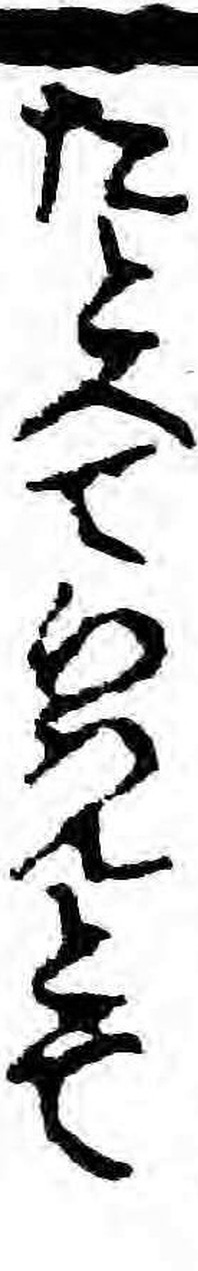たとへていはんとて
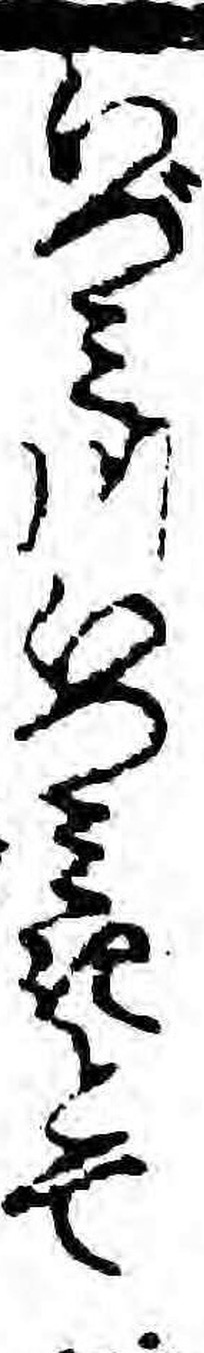いづみ川いつみきとて
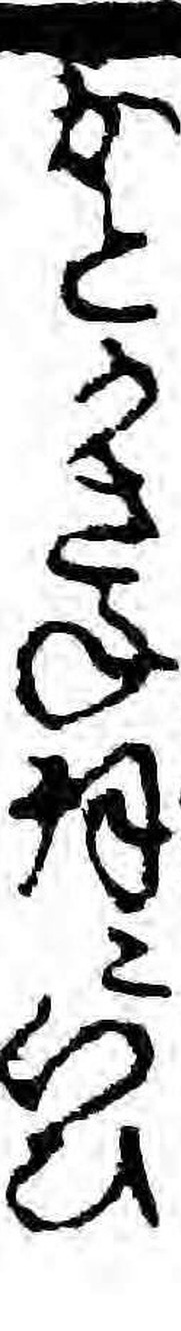かとかさね詞にいひ
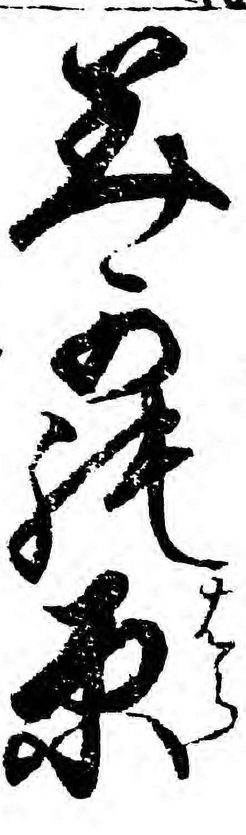みかの原
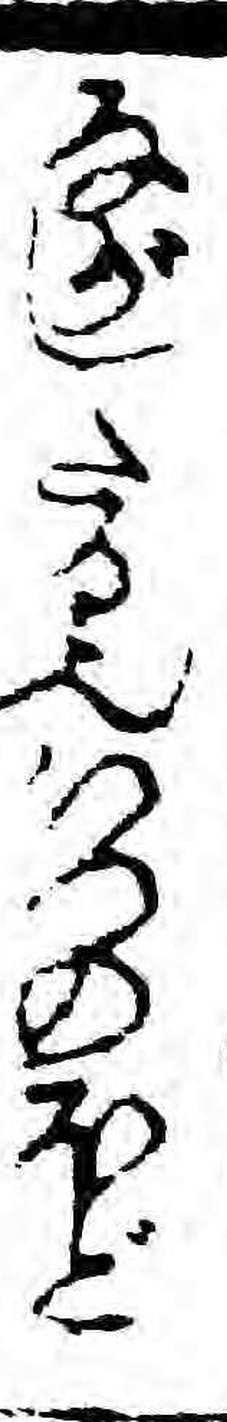ながしたる也いつのほど
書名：頭書和歌注譯／壽賀多百人一首小倉錦
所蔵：国文学研究資料館
